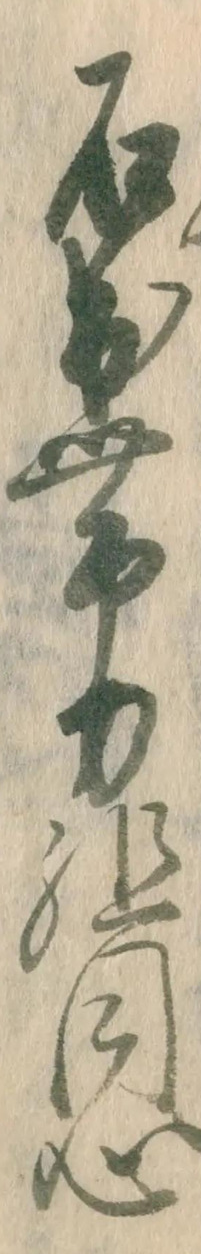石出帯刀組同心

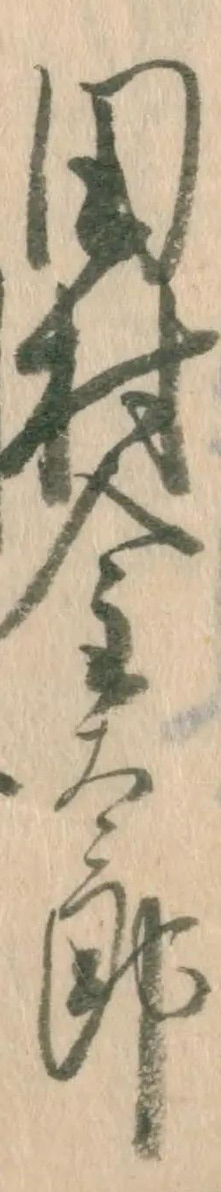田村金太郎
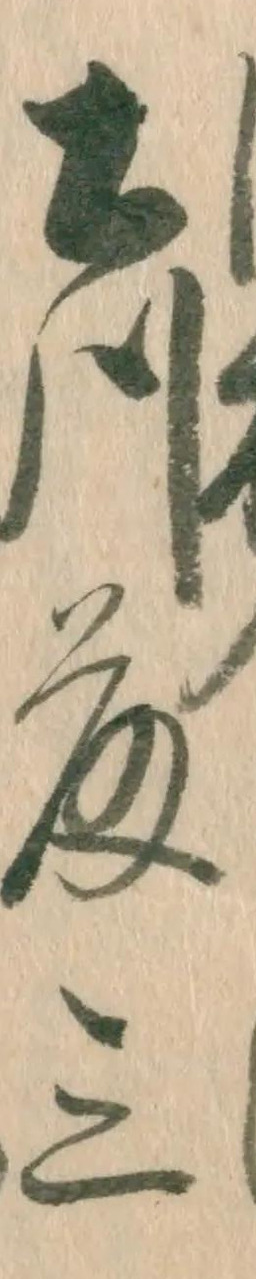大川藤三
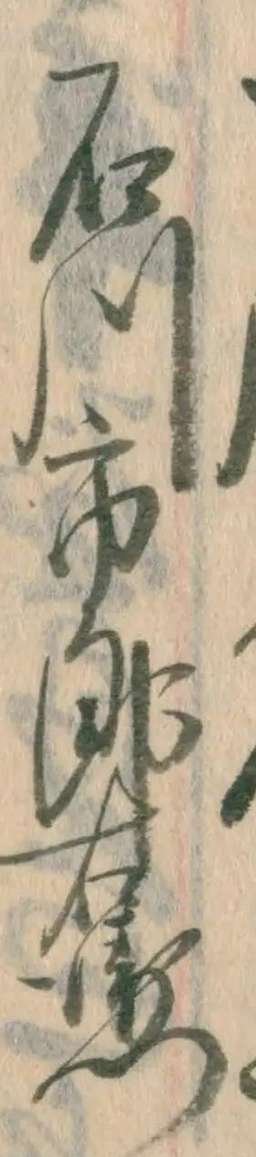石川市郎右衛門
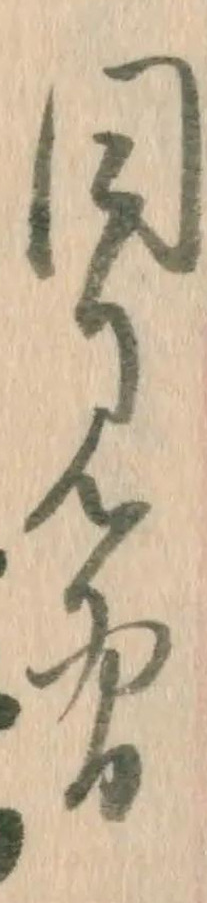同見習
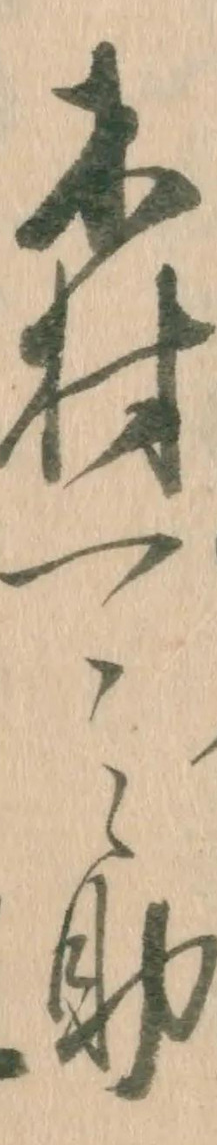木村一之助
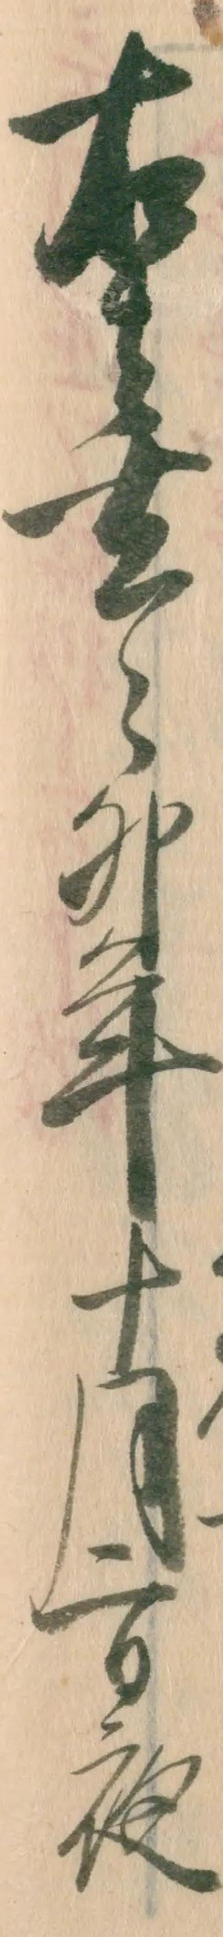右は去〻卯年十月二日夜
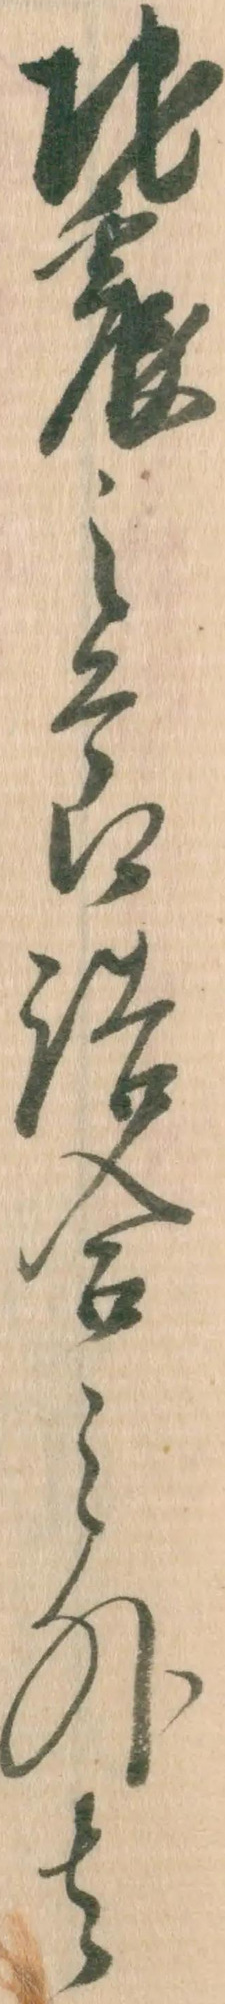地震之節詰合之外は
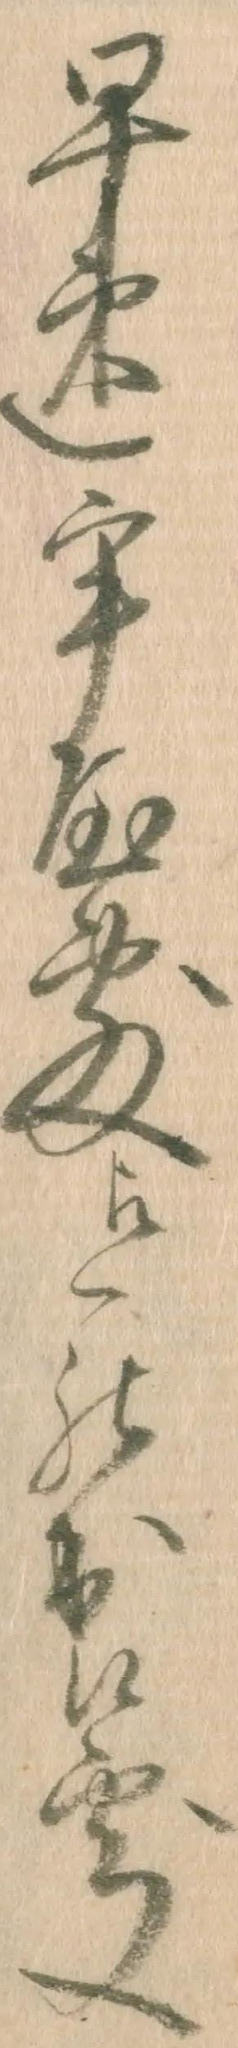早速牢屋敷え罷出候処
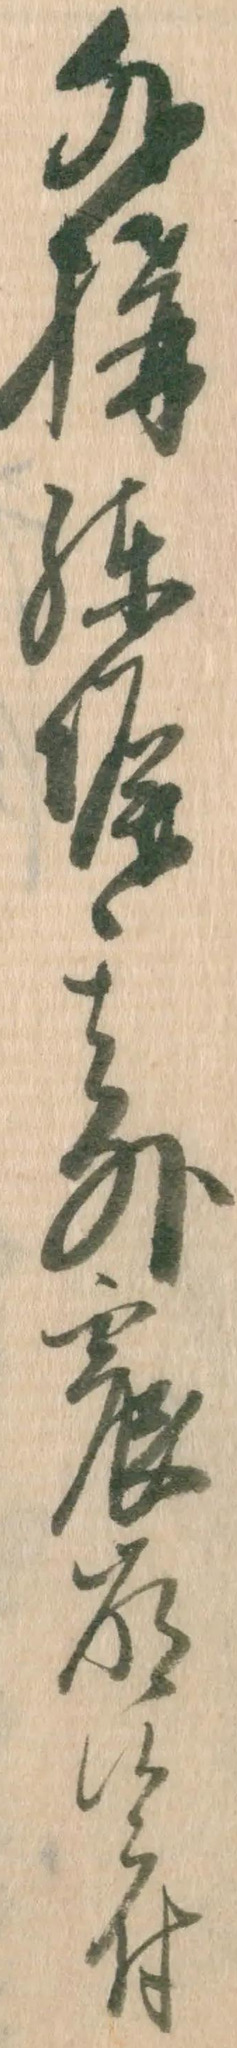外構煉塀其外震崩候ニ付
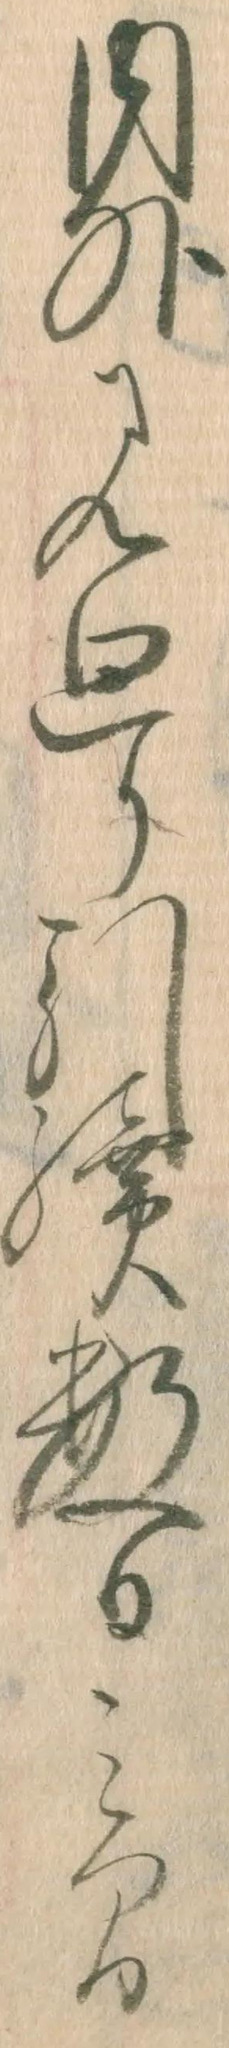内外見廻り引続数日之間
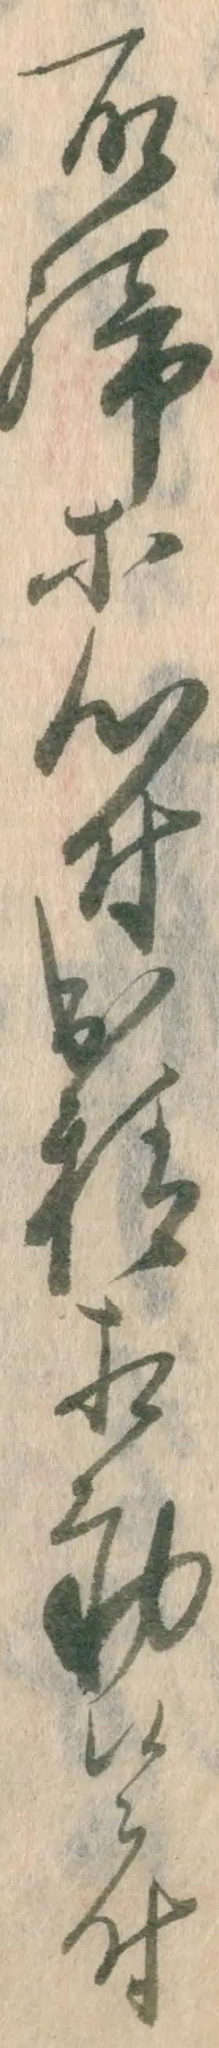取締等心付出精相勤候ニ付
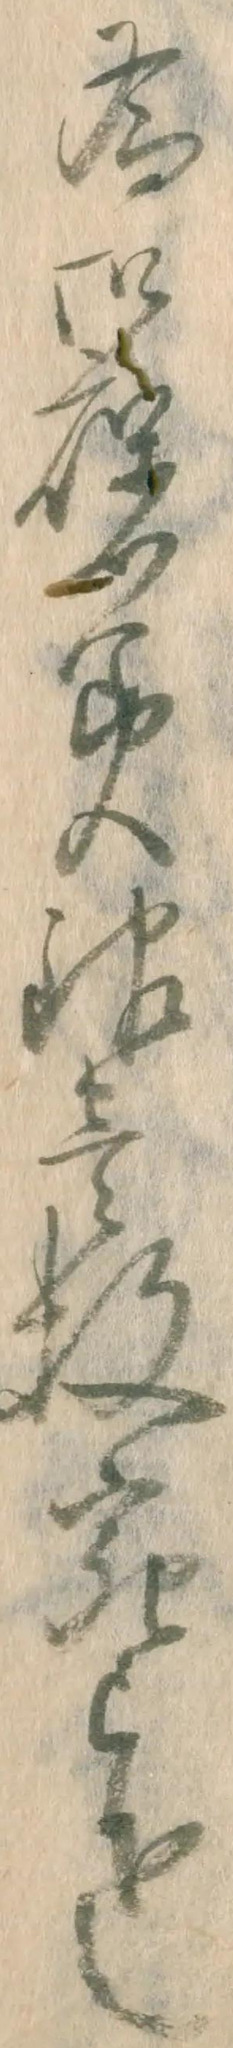為御褒美銀壱枚ツヽ被下之

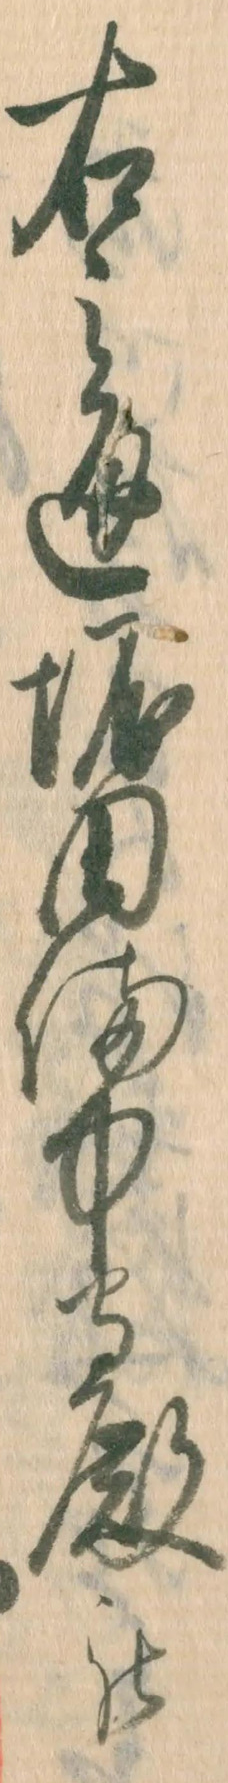右之通堀田備中守殿被
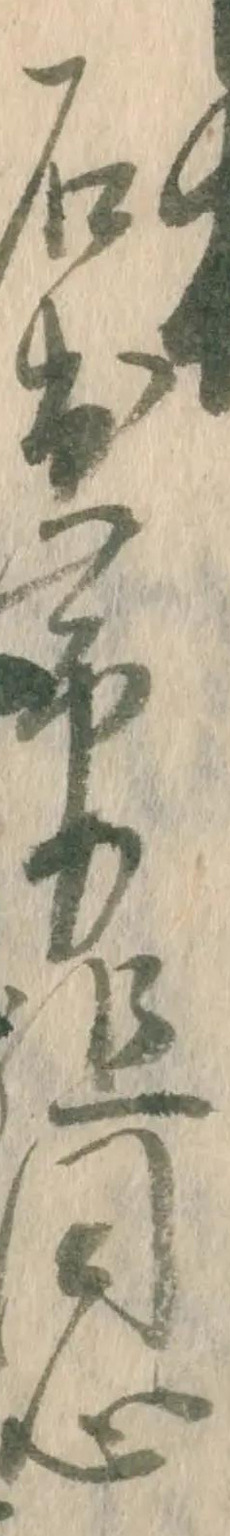石出帯刀組同心
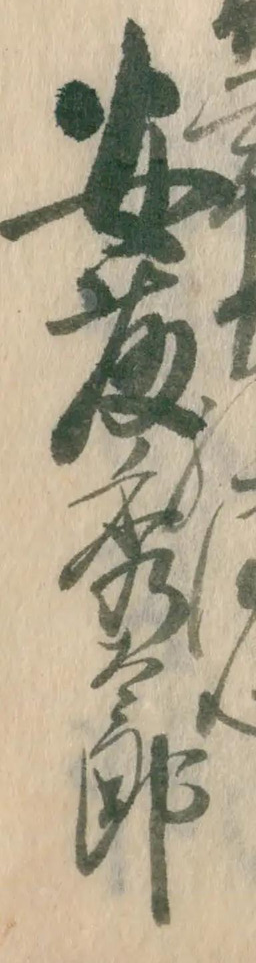安藤秀太郎
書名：七十冊物類集 71巻. [44] 四十三 牢屋敷御普請御修覆地震ニ付骨折候牢屋掛御褒美之部
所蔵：国立国会図書館 National Diet Library, JAPAN
